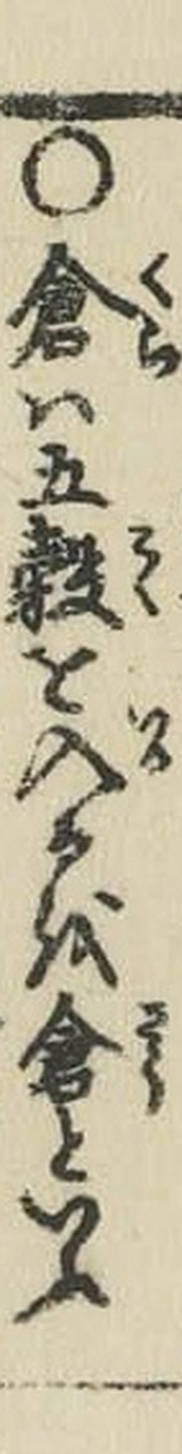○倉は五穀を入るを倉といふ
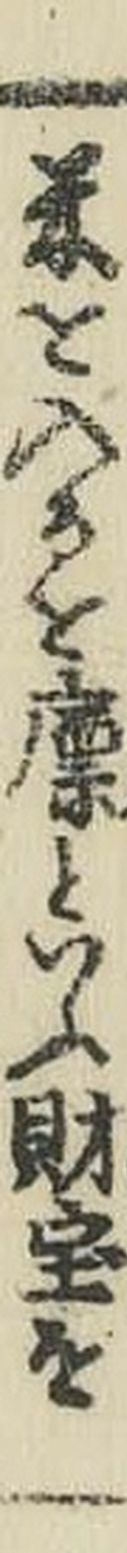米を入るを廩といふ財宝を
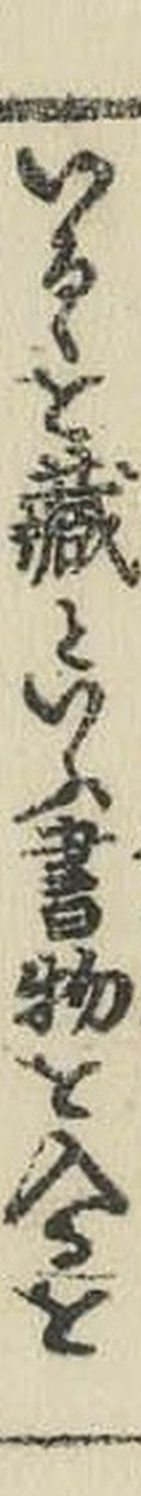いるゝを蔵といふ書物を入るを
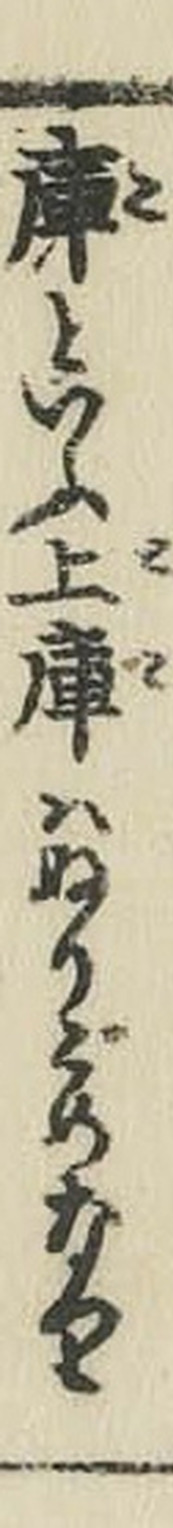庫といふ上庫はぬりごめなり
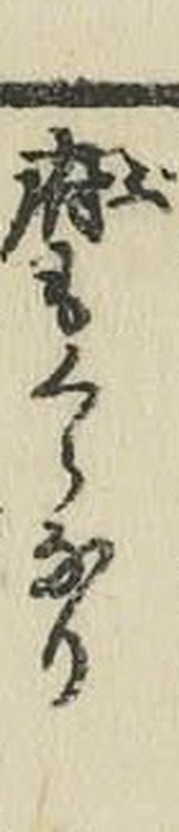府もくらなり
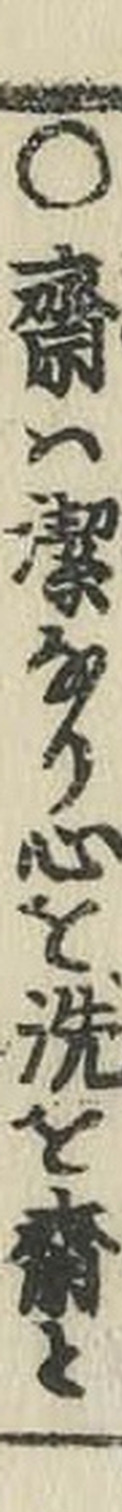○斎は潔なり心を洗を斎と
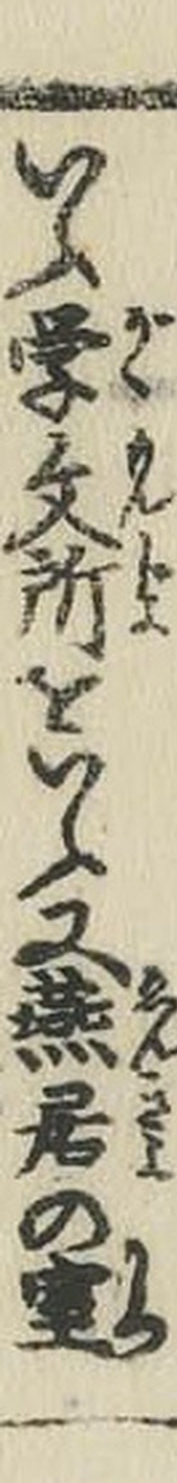いふ学文所をいふ又燕居の室
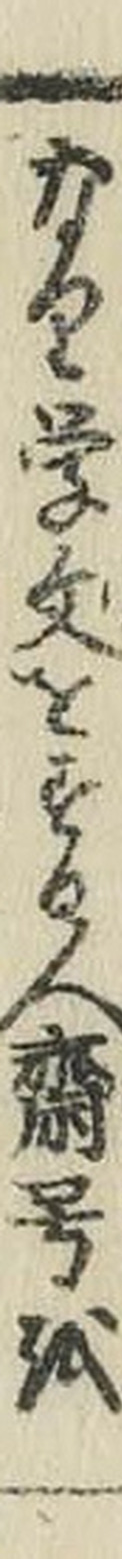なり学文をする人斎号を
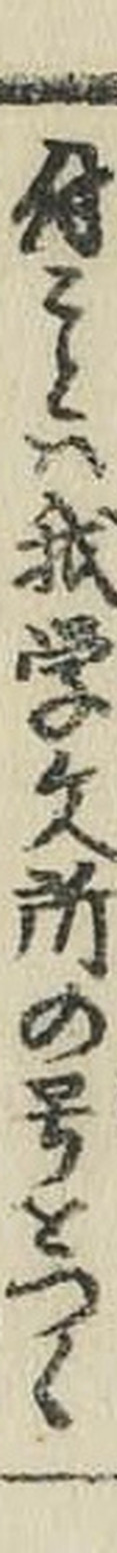付ことは我学文所の号をつく
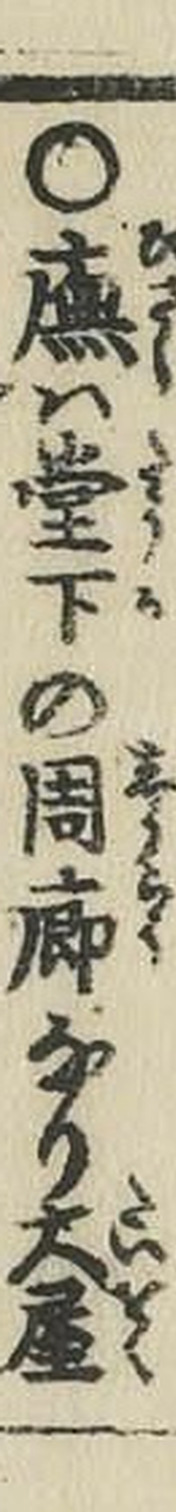○廡は堂下の周廊なり大屋
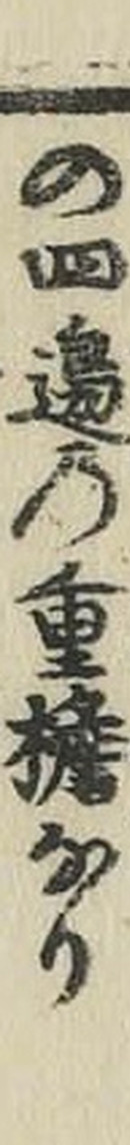の四辺の重檐なり
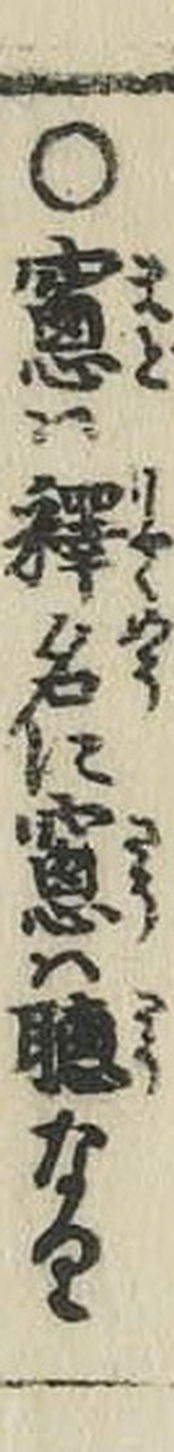○窓は釈名に窓は聡なり
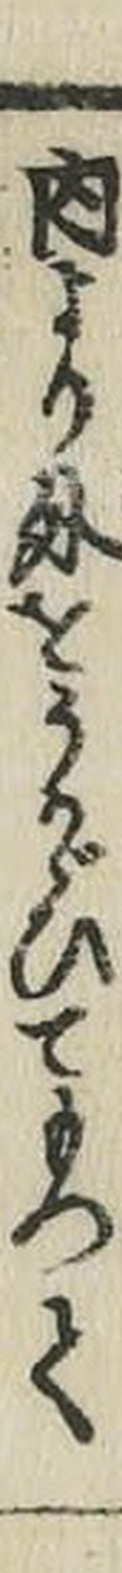内より外をうかゞひてもつて
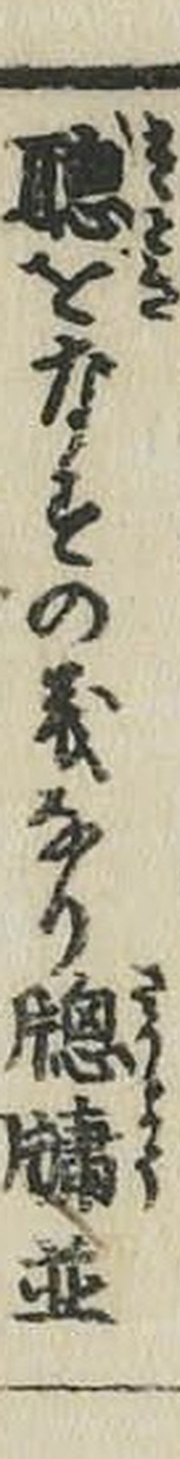聡をなすの義なり牕牖並
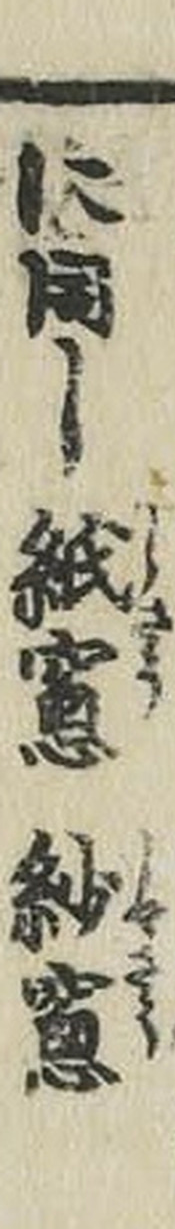に同し紙窓紗窓

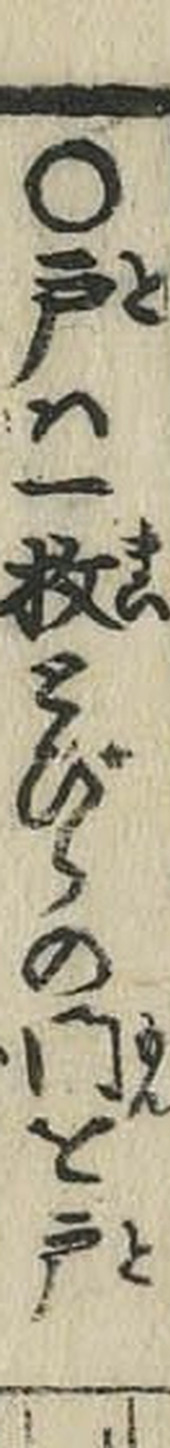○戸は一枚とびらの門を戸
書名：増補頭書訓蒙図彙大成 10巻 2:巻之1-3
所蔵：東京学芸大学教育コンテンツアーカイブ
